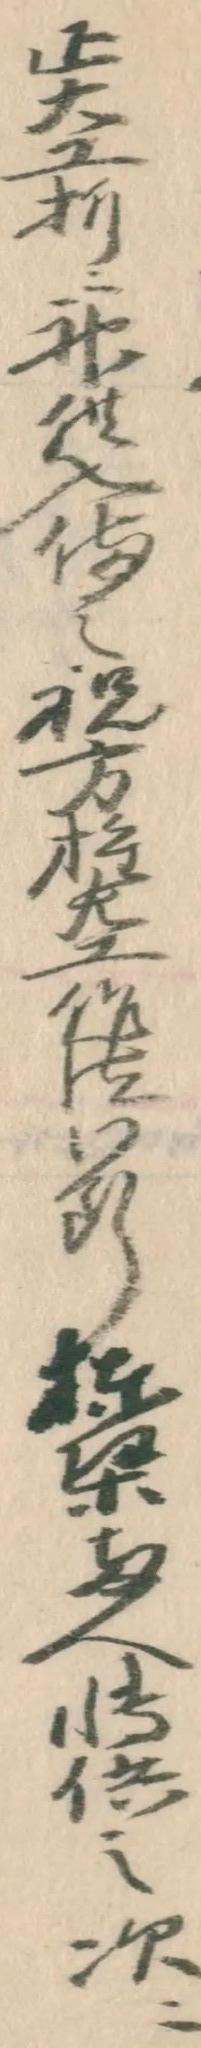正大工折ニ神供入備之祝方権大工作法同断棟梁両人轉供之次ニ
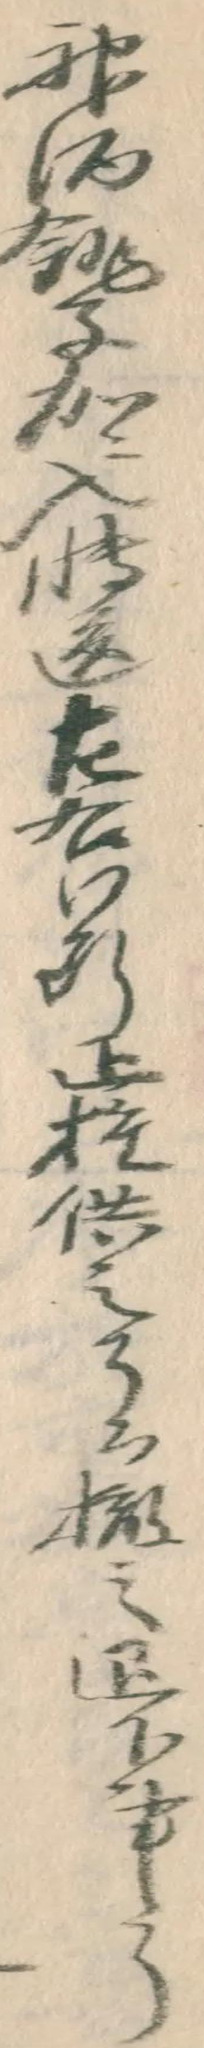神酒銚子加ニ入転送左右同断止権供之了而撒之退下事了
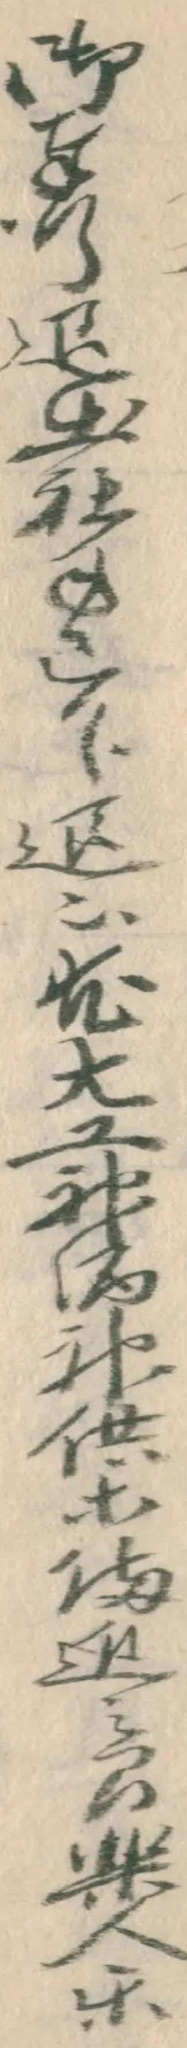御奉行退出社司已下退出尤大工神酒神供等備近之間楽人楽
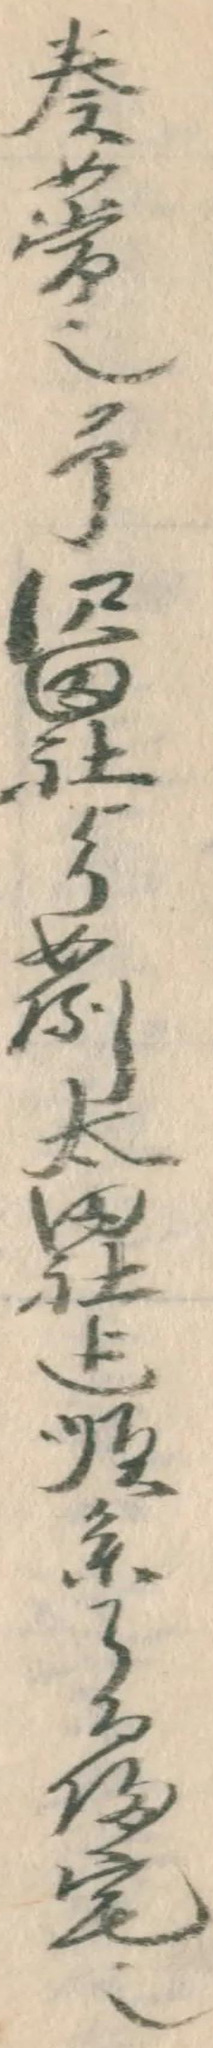奏如常也予沢田社より如例太田社迄順参了而帰宅也
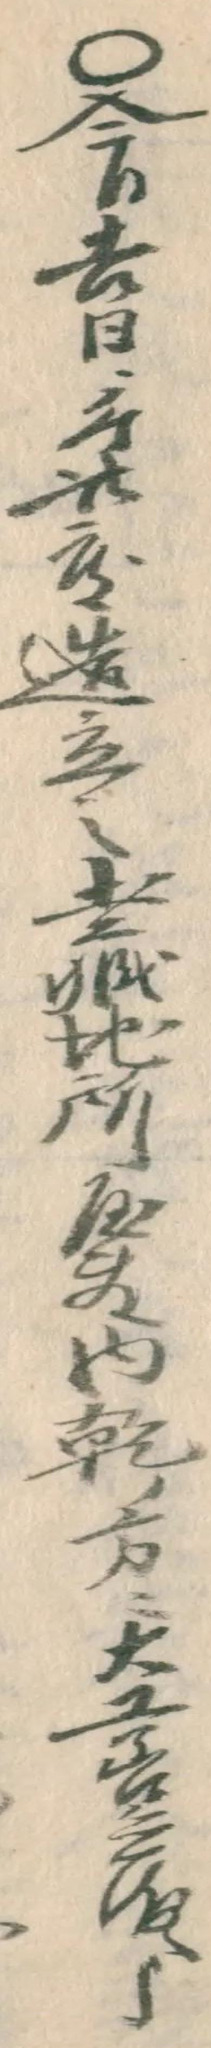○今日吉日ニ付此度造立之土蔵地所屋敷内乾ノ方ニ大工善兵衛へ申
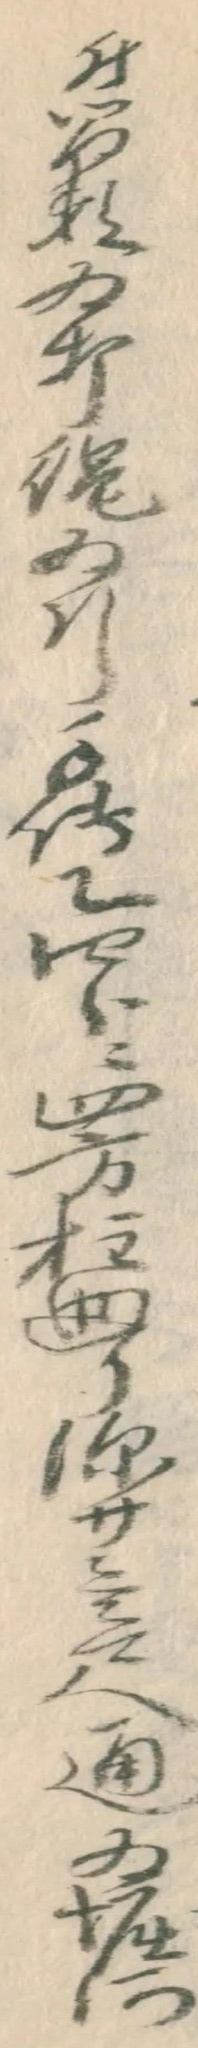付留頼為打縄為引手傳乙四郎ニ四方柱廻リ源サ壱人通為堀河
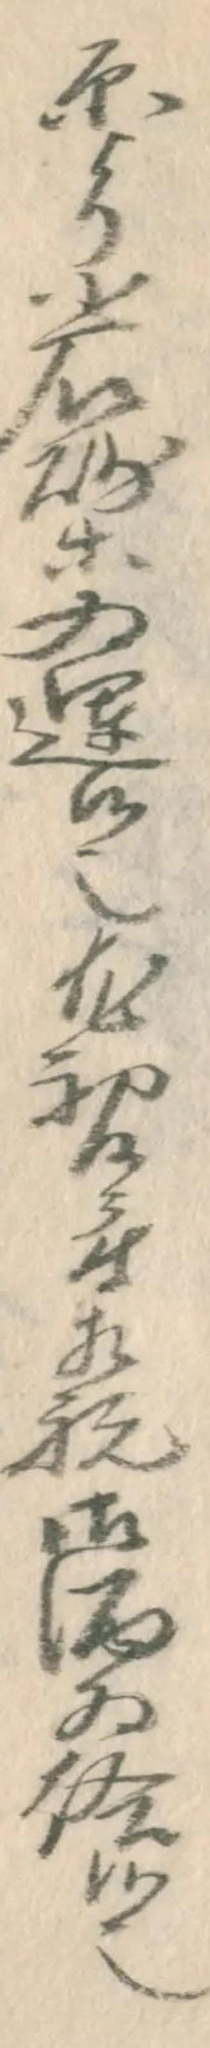原より小石砂等為運候之尤初日ニ付相祝御酒為給候也
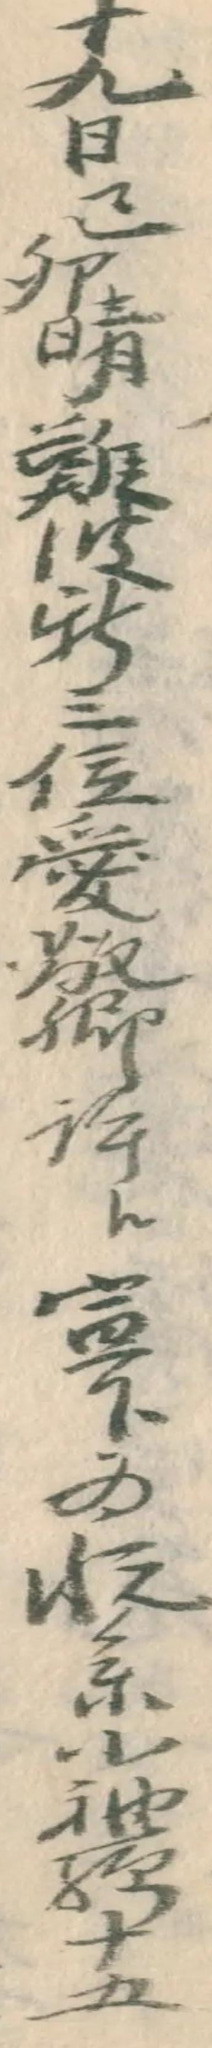十九日己卯晴難波新三位愛敬卿許え宣下為悦参小袖綿十五
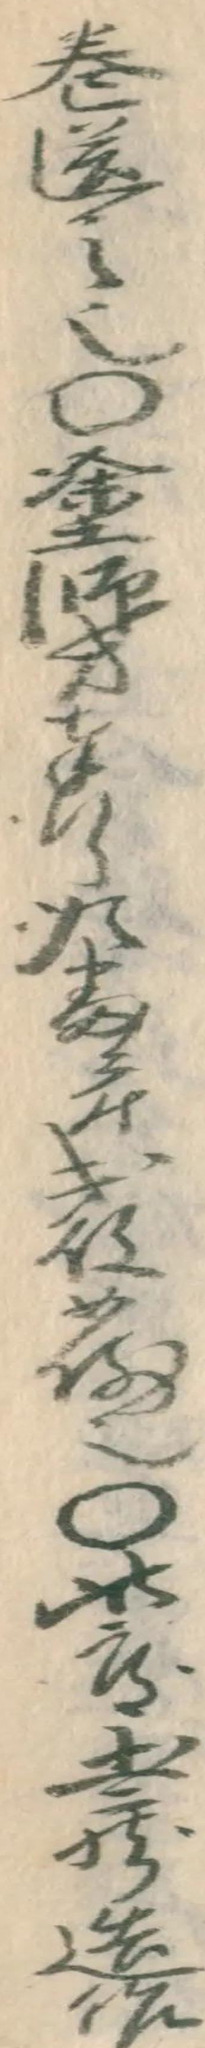巻送之也○塗師方奉行順番ニ付出役如例也○此度土蔵造作

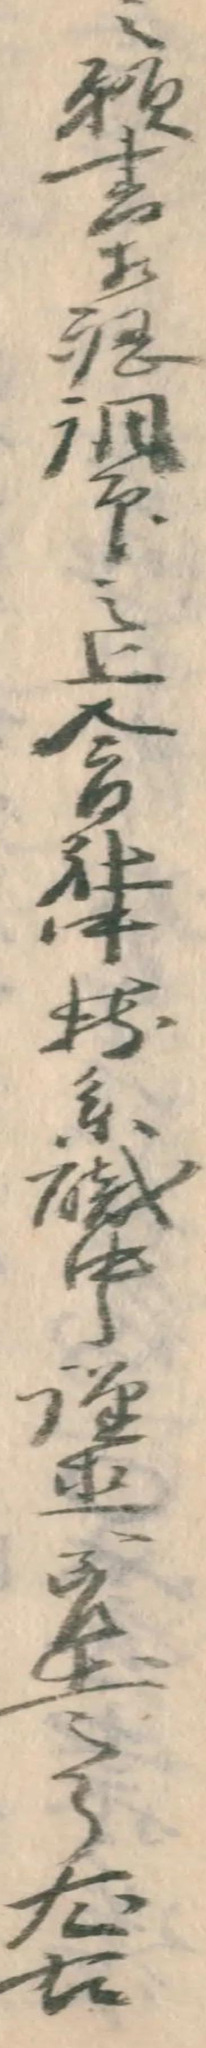之願書相認調印之上今日社中持参職中之謹直へ差出之了左右
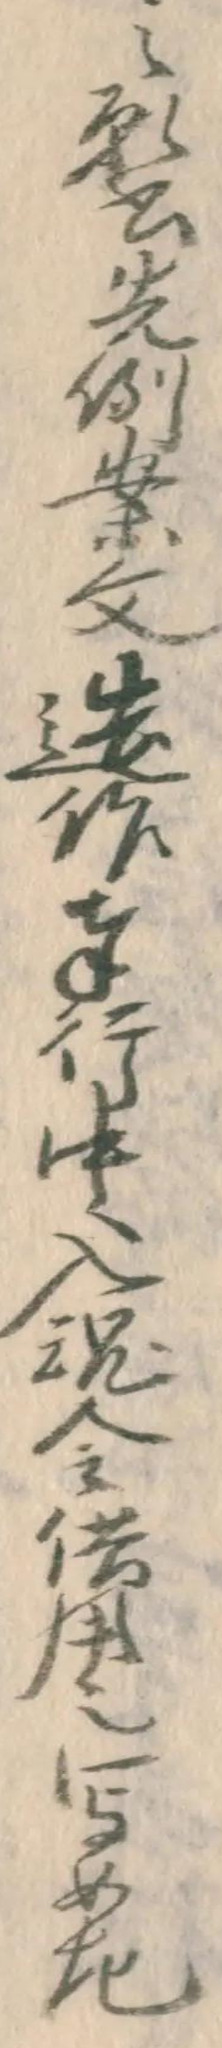之願書先例案文造作奉行中へ入魂金借用之写如左
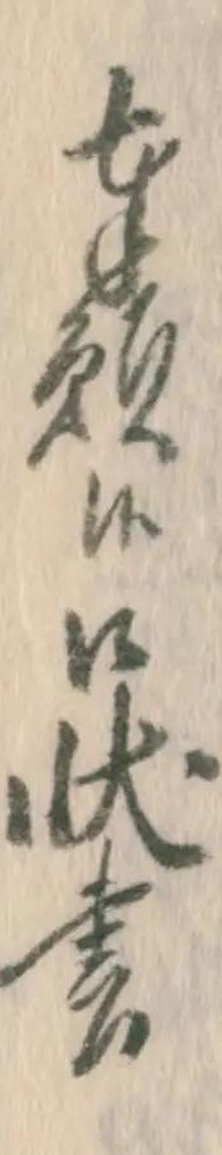奉願候口状書
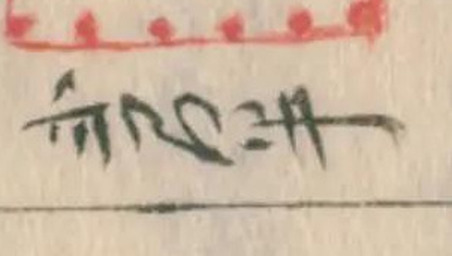弐間半
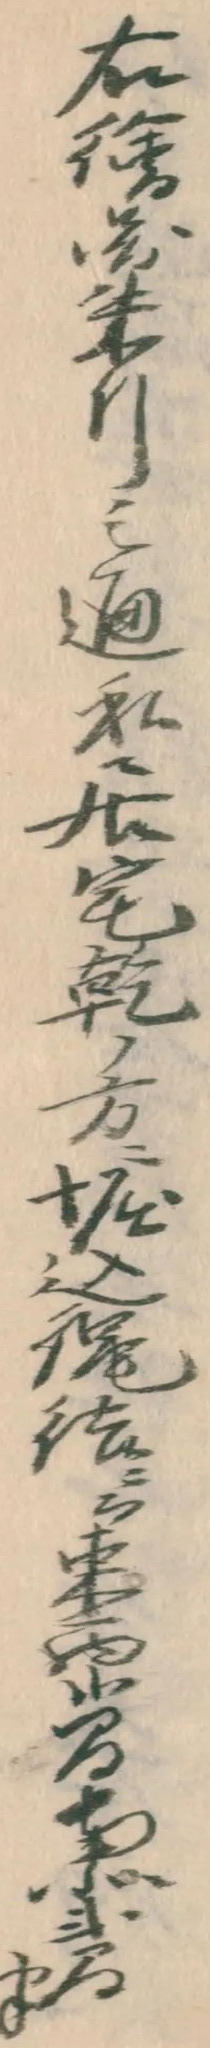右絵図朱引之通私居宅乾ノ方ニ堀込縄詰ニ而東西弐間南北弐間半
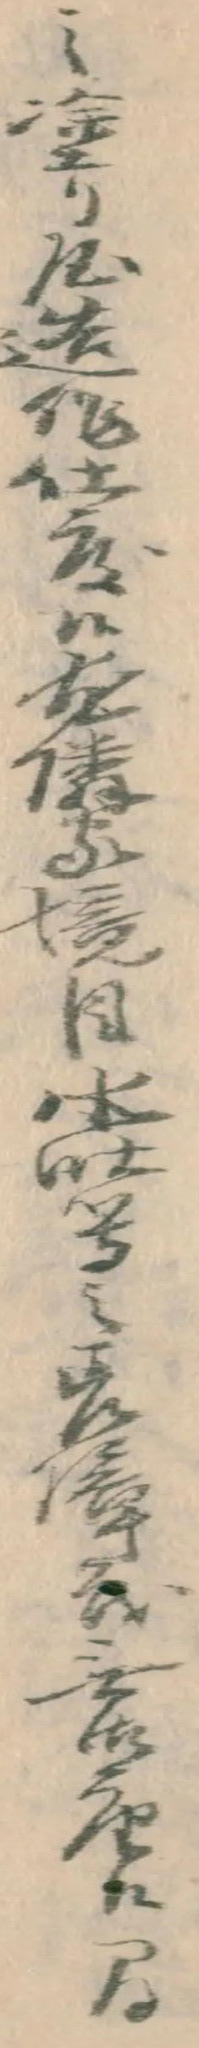之塗リ屋造作仕度候尤隣家境目水吐等之差障も無御座候間
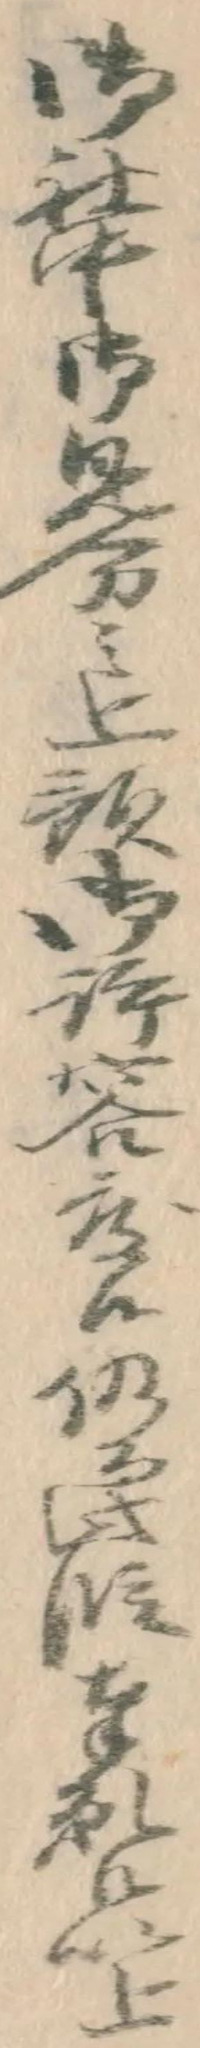御社中御見分之上預御許容落候仍而此段奉願候以上
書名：賀茂社記録. 第67冊
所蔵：国立国会図書館 National Diet Library, JAPAN
